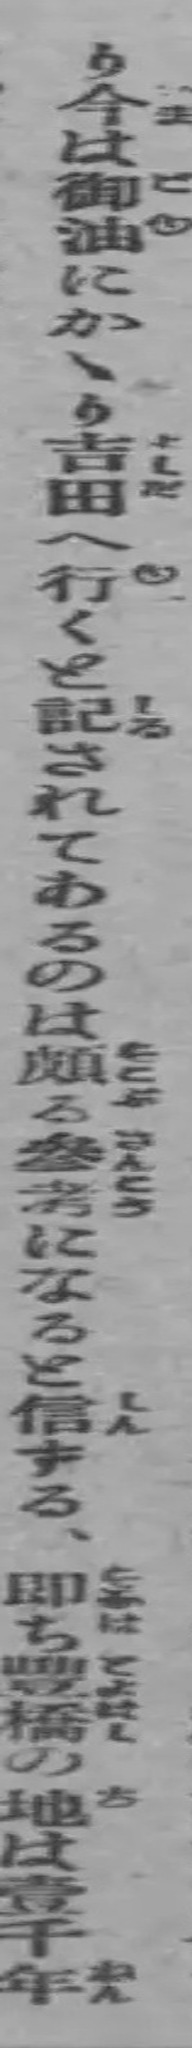り今は御油にかゝり吉田へ行くと記されてあるのは頗る参考になると信ずる、即ち豊橋の地は壹千年
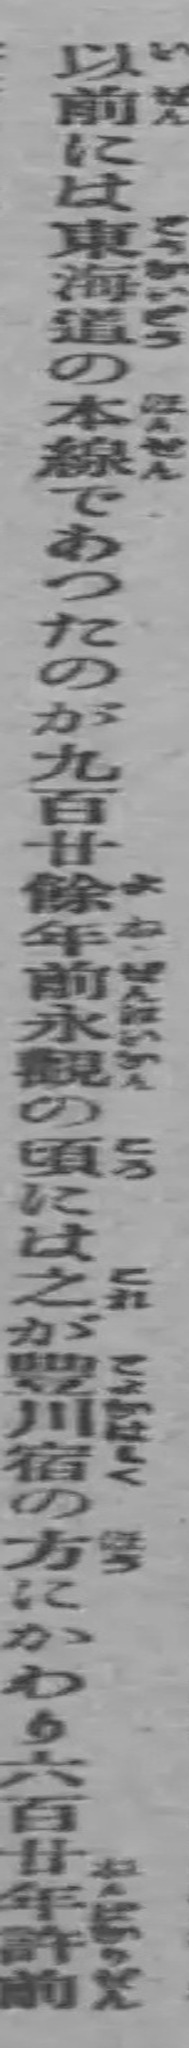以前には東海道の本線であつたのが九百廿余年前永観の頃には之が豊川宿の方にかわり六百廿年許前
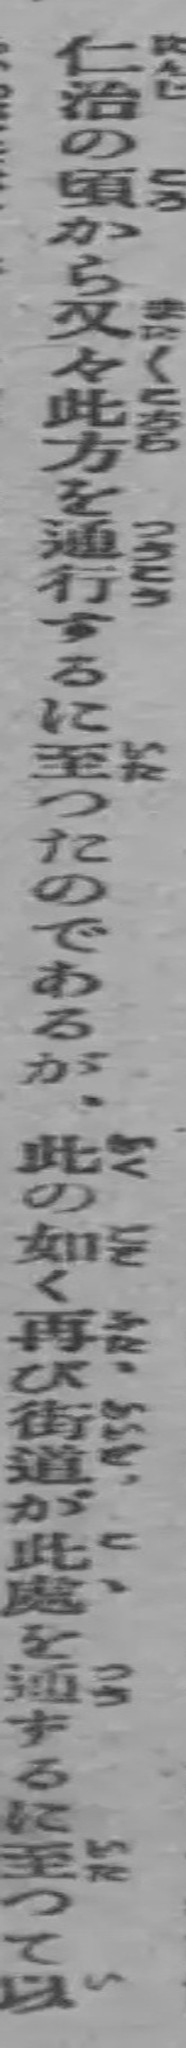仁治の頃から又々此方を通行するに至つたのであるが、此の如く再び街道が此処を通ずるに至つて以
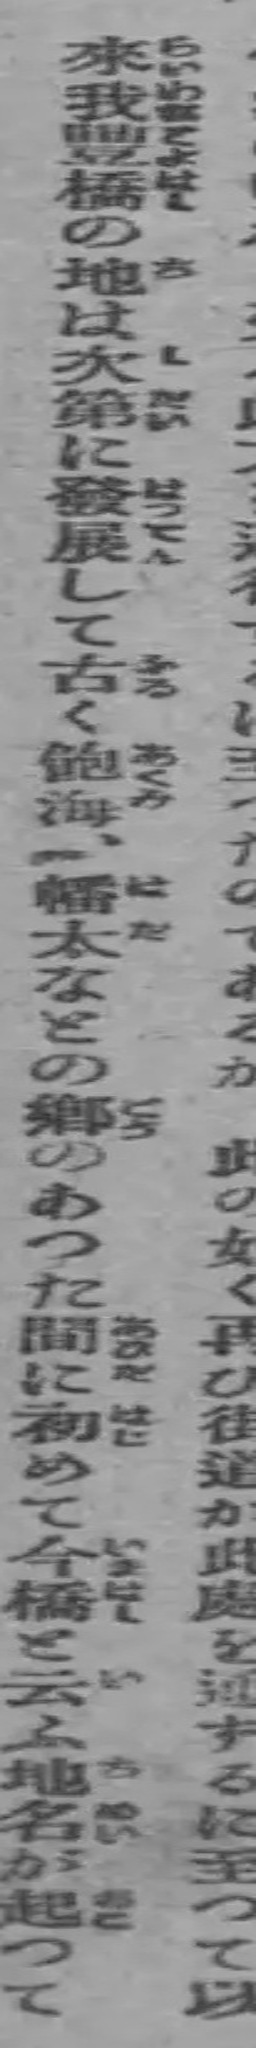今橋之地名来我豊橋の地は次第に発展して古く飽海、幡太なとの郷のあつた間に初めて今橋と云ふ地名が起つて

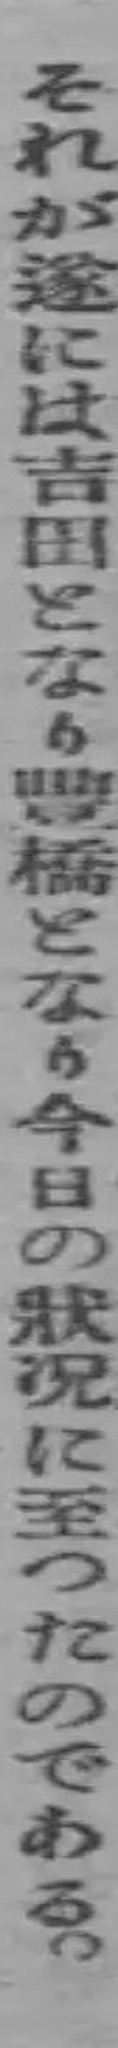それが遂には吉田となり豊橋となり今日の状況に至つたのである。
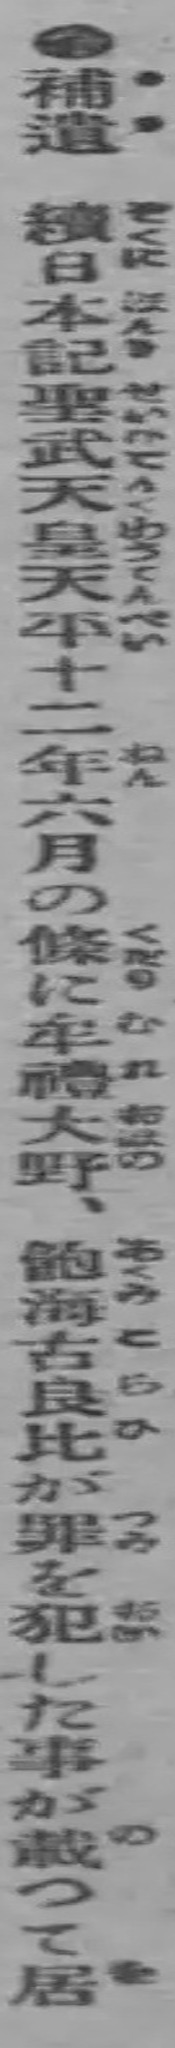●補遺続日本記聖武天皇天平十二年六月の条に牟礼大野、飽海古良比が罪を犯した事が載つて居
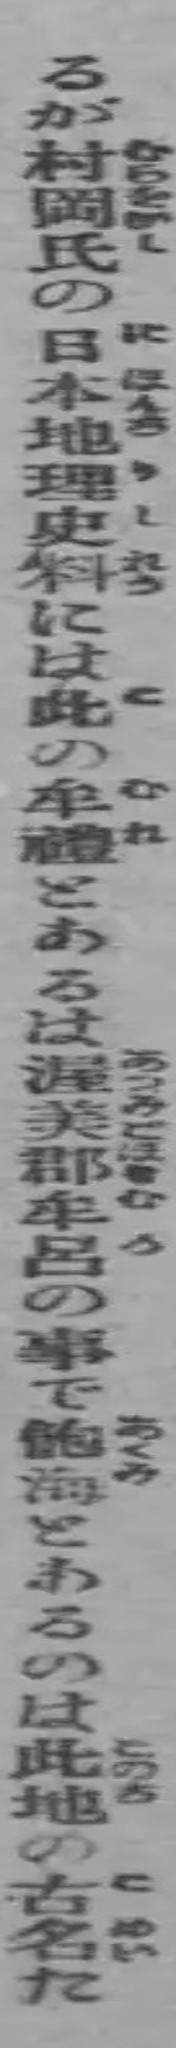るが村岡氏の日本地理史料には此の牟礼とあるは渥美郡牟呂の事で飽海とあるのは此地の古名た
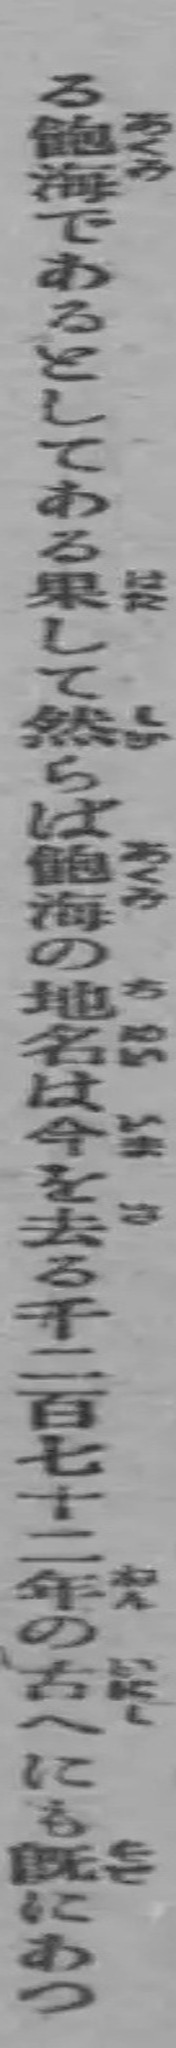る飽海であるとしてある果して然らば飽海の地名は今を去る千二百七十二年の古へにも既にあつ
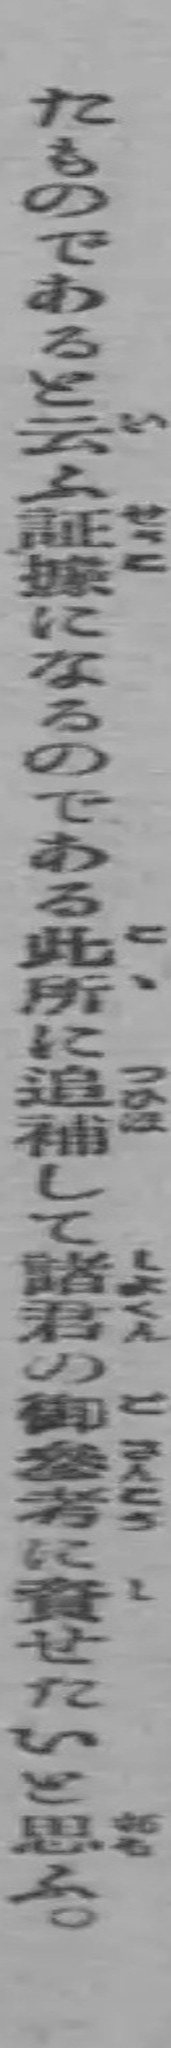たものであると云ふ証拠になるのである此所に追補して諸君の御参考に資せたいと思ふ。
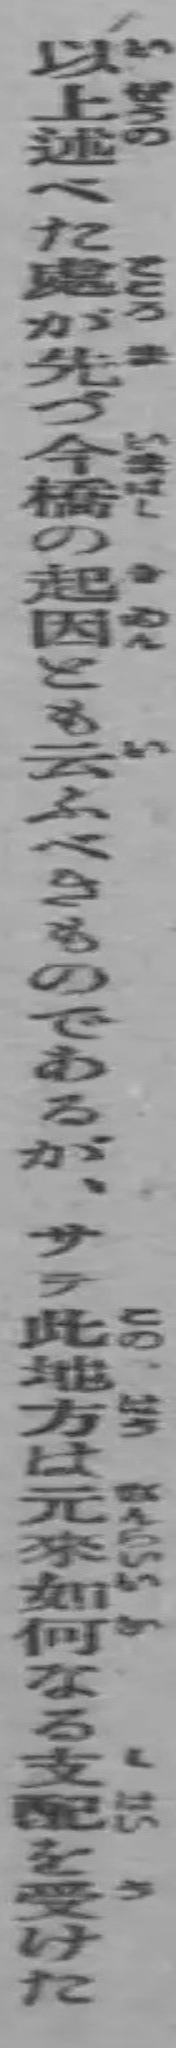以上述べた処が先づ今橋の起因とも云ふべきものであるが、サテ此地方は元来如何なる支配を受けた
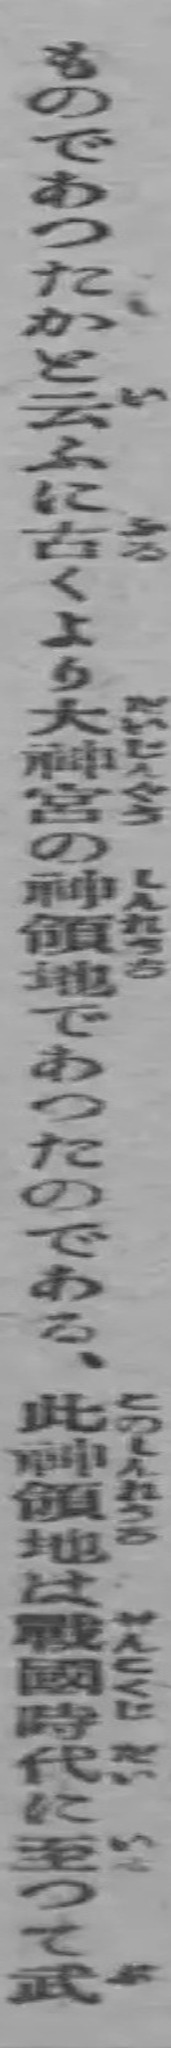神領地ものであつたかと云ふに古くより大神宮の神領地であつたのである、此神領地は戦国時代に至つて武
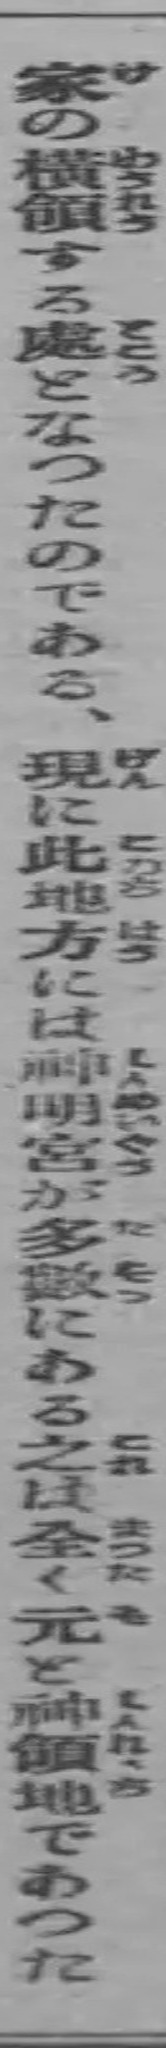家の横領する処となつたのである、現に此地方には神明宮が多数にある之は全く元と神領地であつた
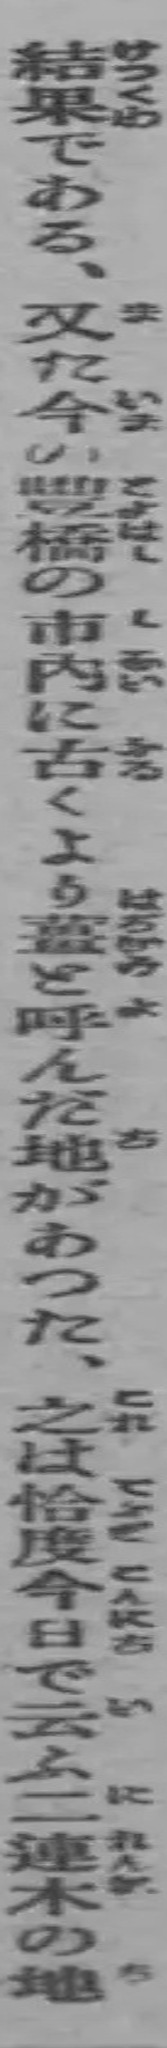結果である、又た今の豊橋の市内に古くより薑と呼んだ地があつた、之は恰度今日で云ふ二連木の地
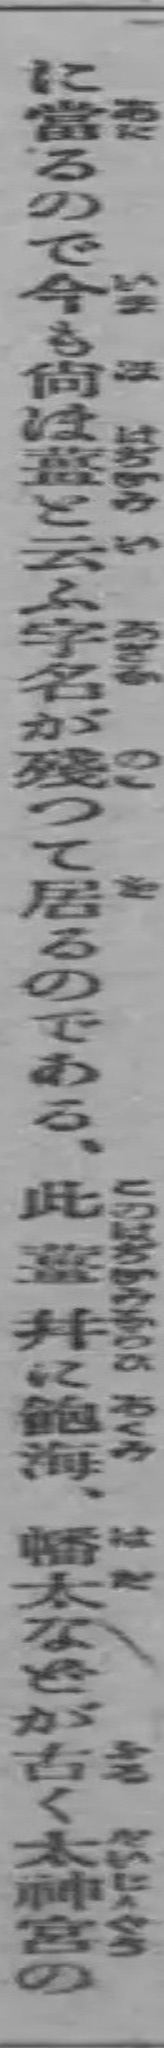薑の地名に当るので今も尚ほ薑と云ふ字名が残つて居るのである、此薑幷に飽海、幡太などが古く大神宮の
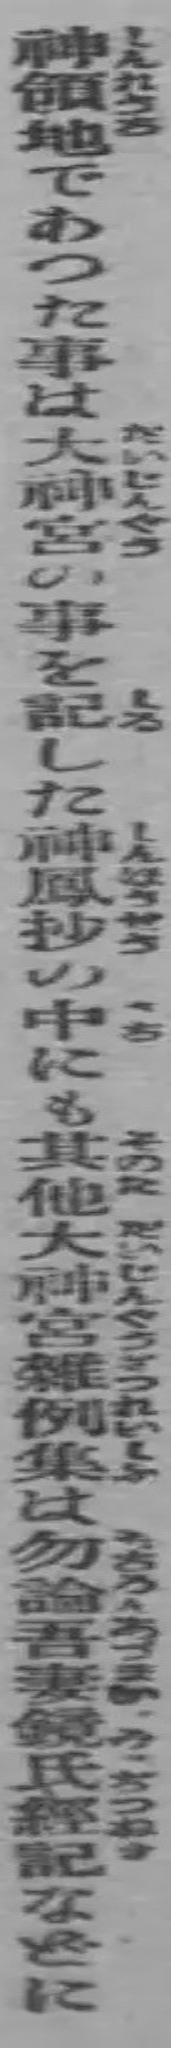神領地であつた事は大神宮の事を記した神鳳抄の中にも其他大神宮雑例集は勿論吾妻鏡氏経記などに
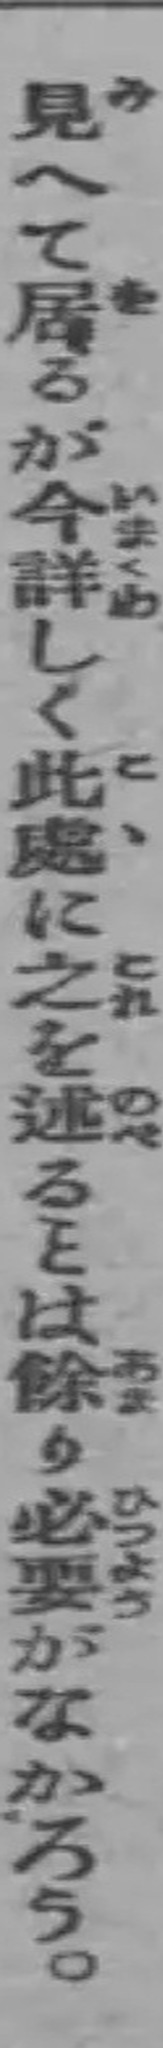見へて居るが今詳しく此処に之を述ることは余り必要がなかろう。
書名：豊橋市史談
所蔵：国立国会図書館 National Diet Library, JAPAN
